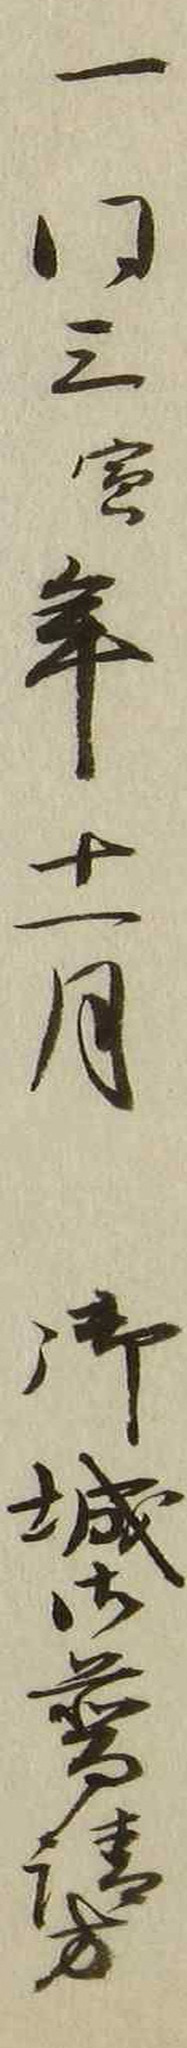一同三寅年十一月御城御普請方
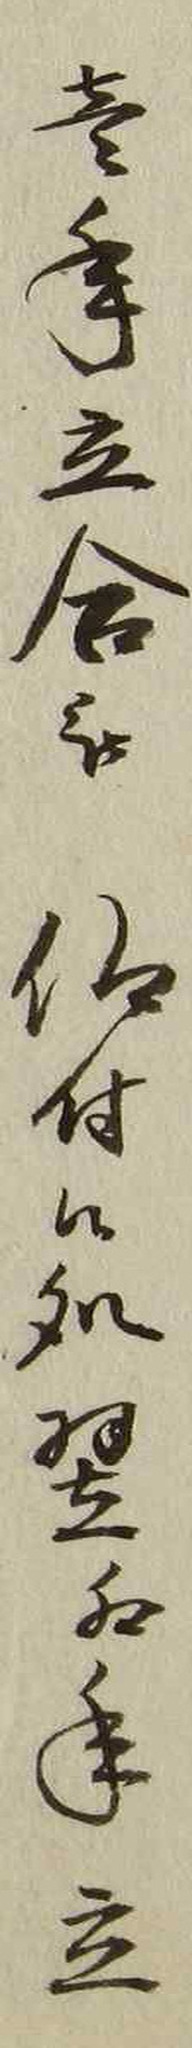壱年立合被仰付候処翌卯年立
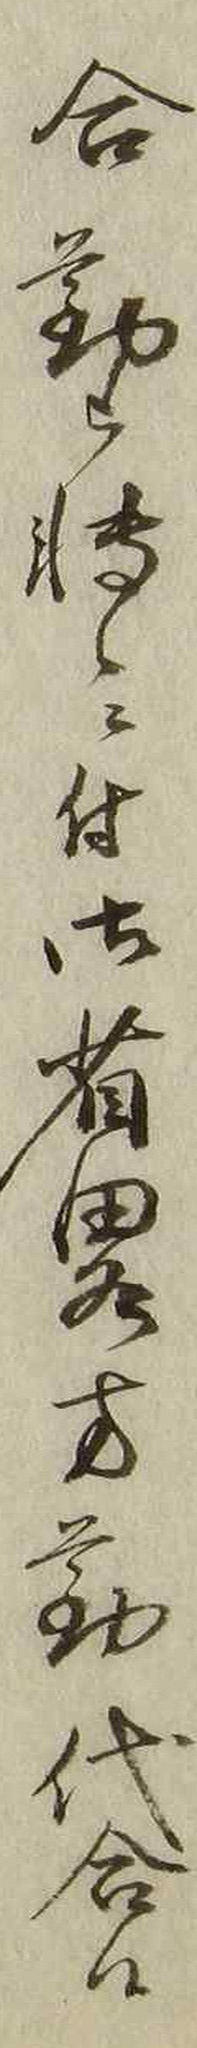合勤被転候ニ付御省略方勤代合候
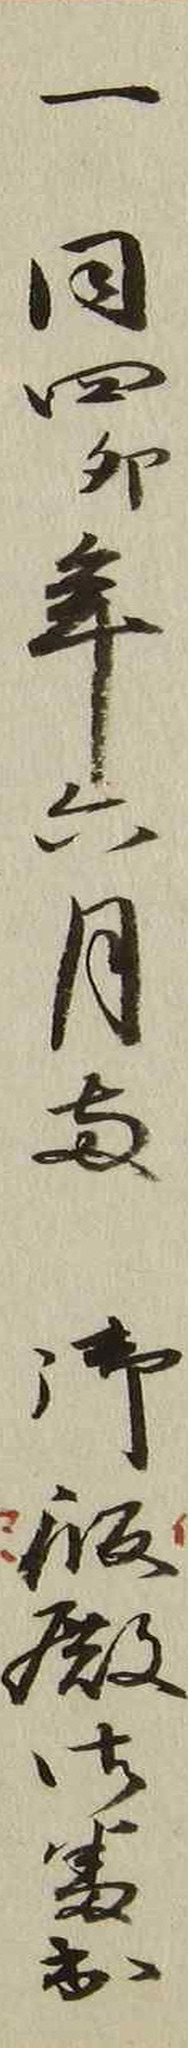一同四卯年六月両御仮殿御番出
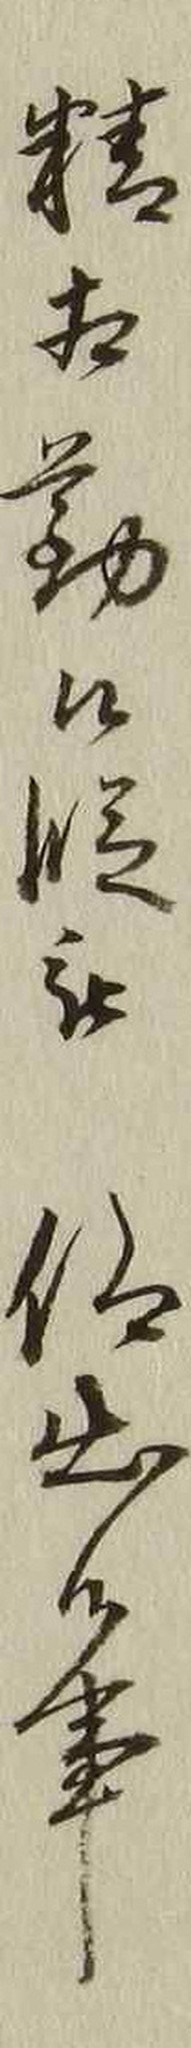精相勤候段被仰出候事
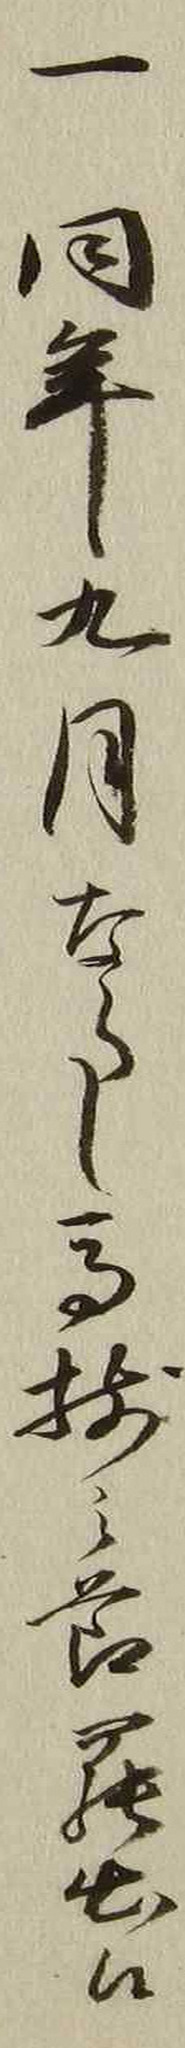一同年九月ならし馬揃之節罷出候
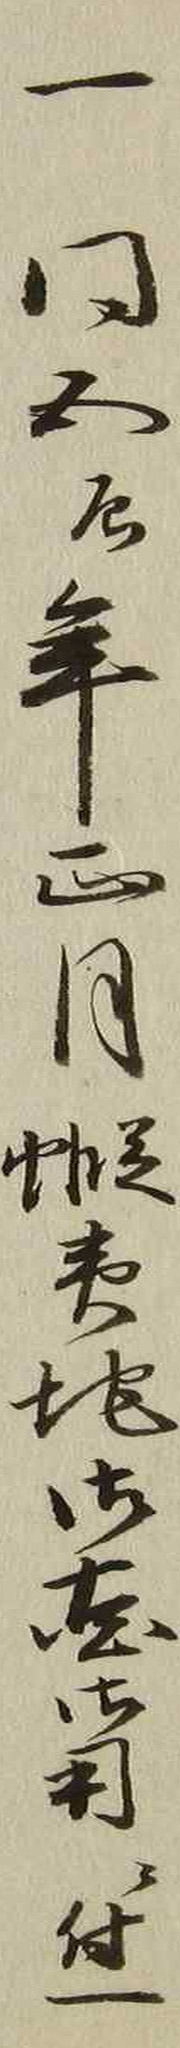一同五辰年正月蝦夷地御固御用ニ付一
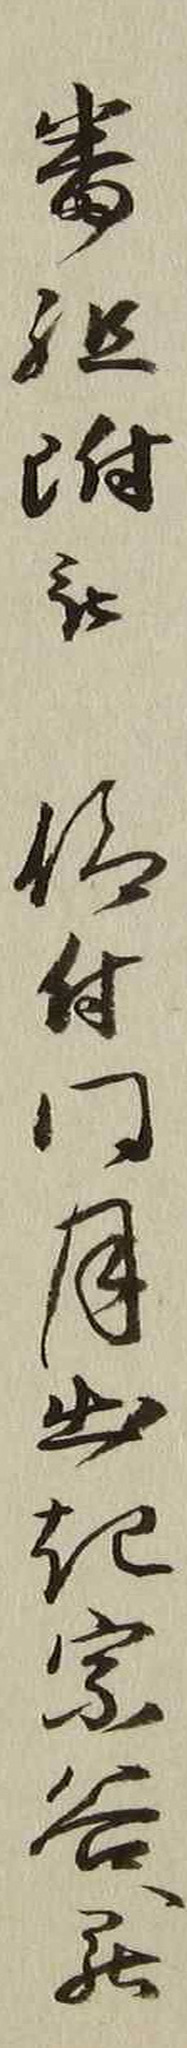番組附被仰付同月出起宗谷へ罷
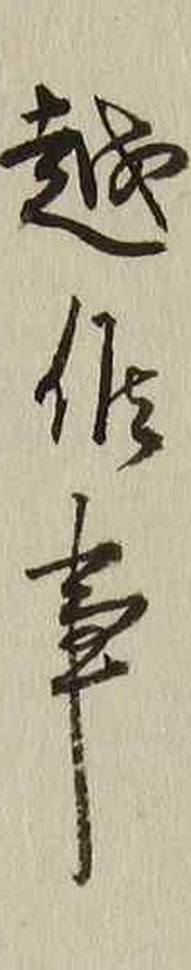越候事
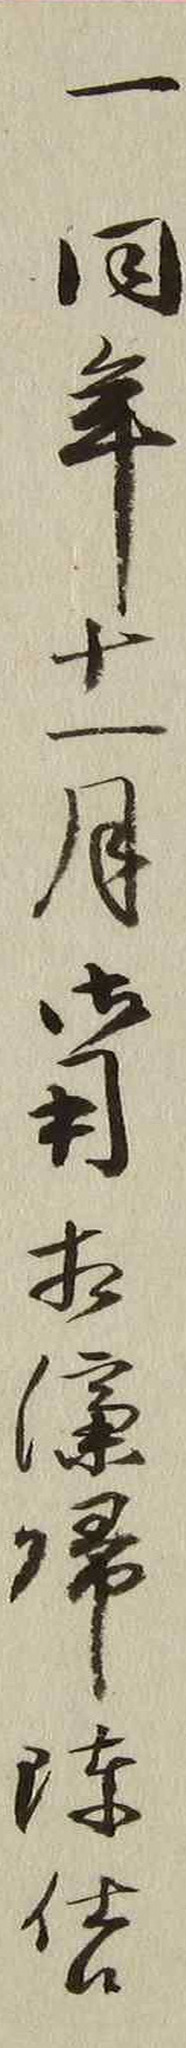一同年十一月御用相済帰陣仕候
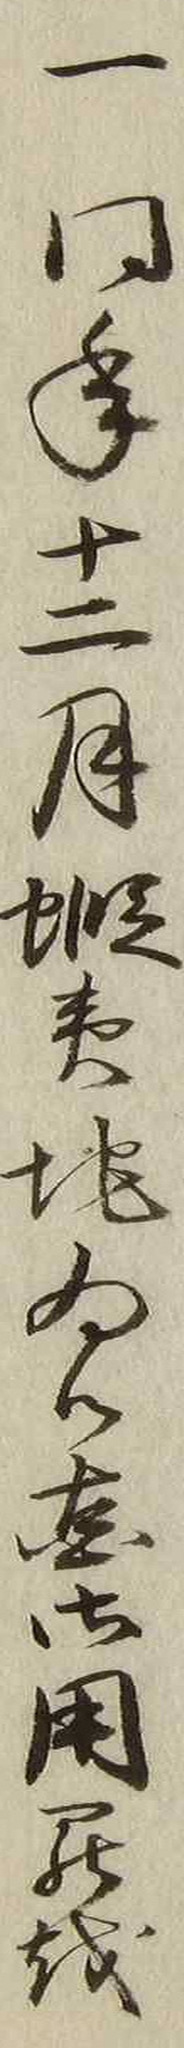一同年十二月蝦夷地為御固御用罷越
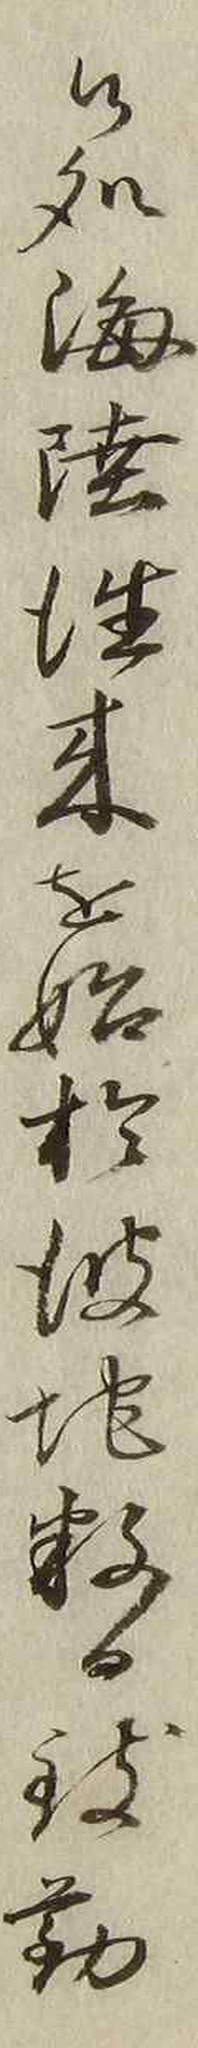候処海陸往来を始於彼地数日致勤
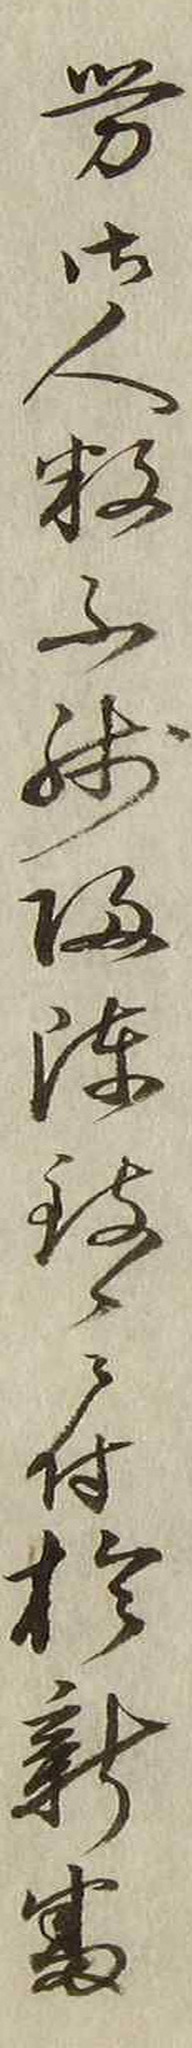労御人数不残帰陣致候ニ付於新番
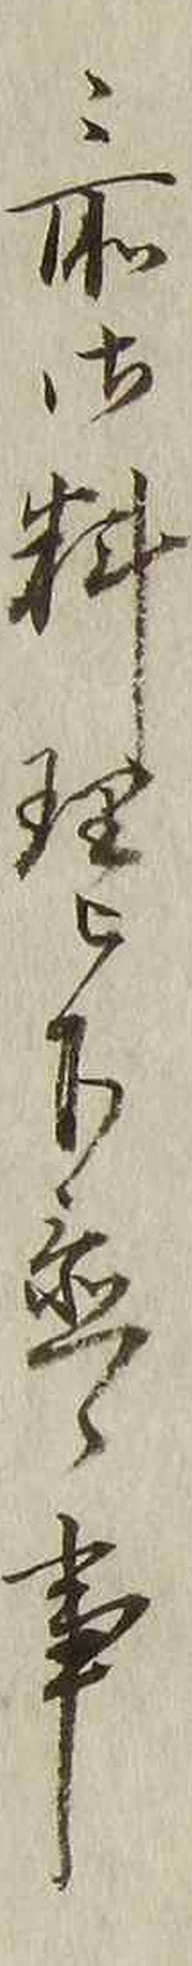〻所御料理被下置候事
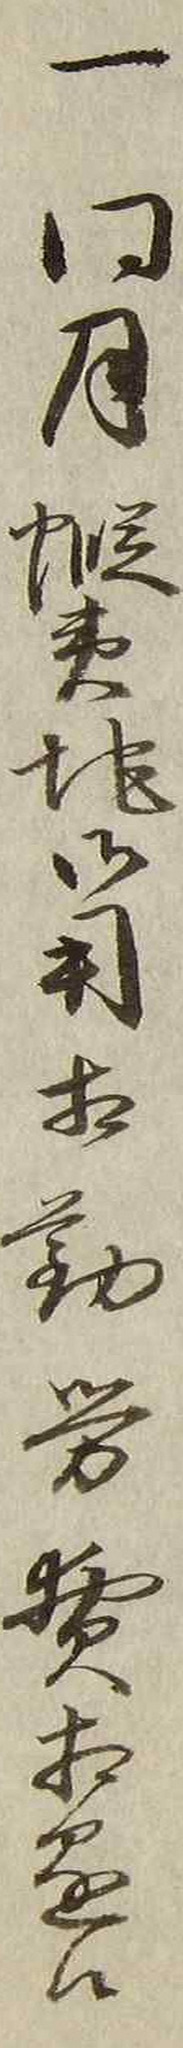一同月蝦夷地御用相勤労費相懸候
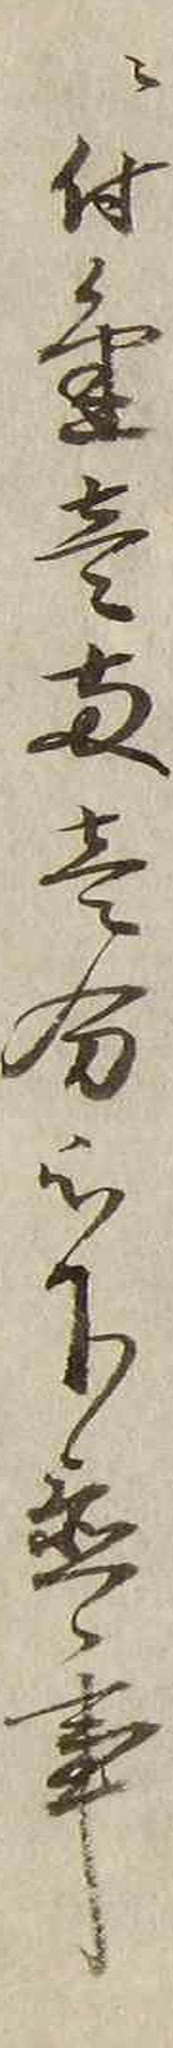ニ付金壱両壱分被下置候事
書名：諸士系譜　巻之102　か之部10
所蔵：会津若松市立会津図書館
